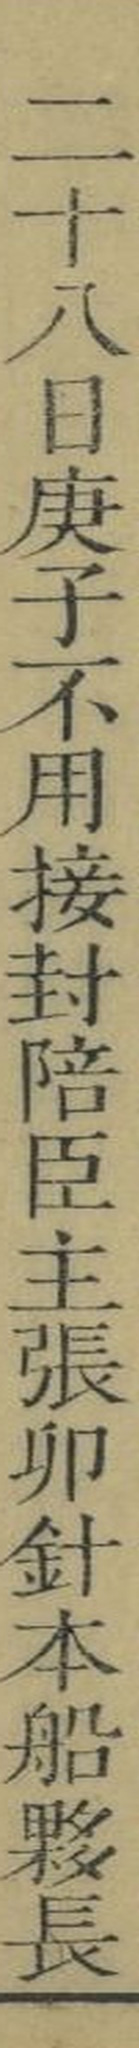二十八日庚子不用接封陪臣主張卯針本船夥長
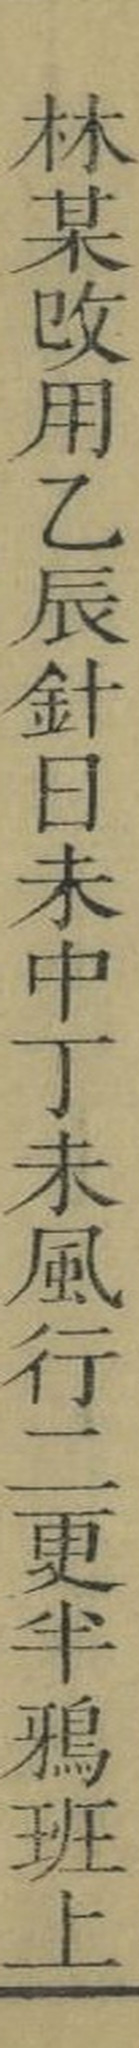林某攺用乙辰針日未中丁未風行二更半鴉班上
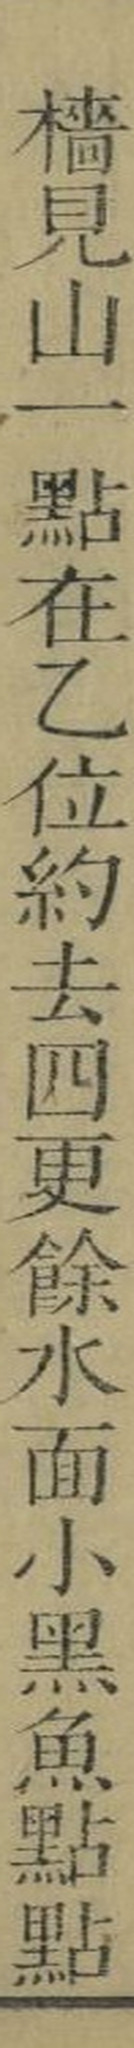檣見山一點在乙位約去四更餘水面小黑魚點點
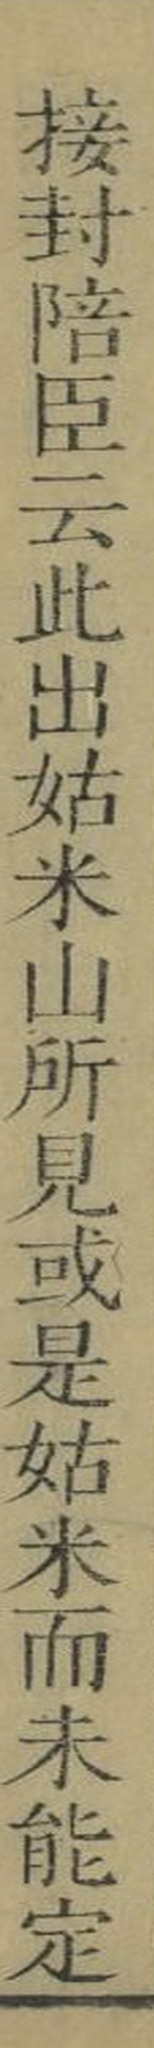接封陪臣云此出姑米山所見或是姑米而未能定
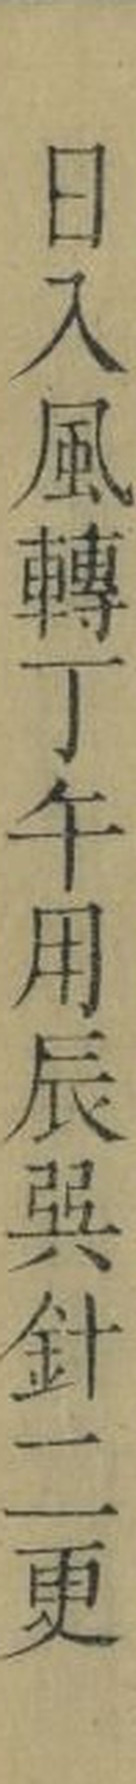日入風轉丁午用辰㢲針二更
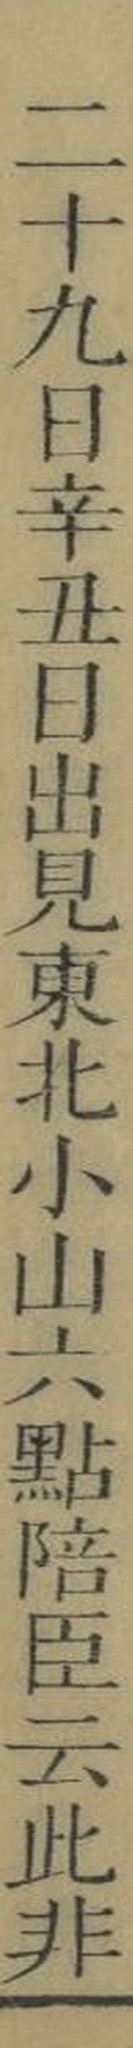二十九日辛丑日出見東北小山六點陪臣云此非

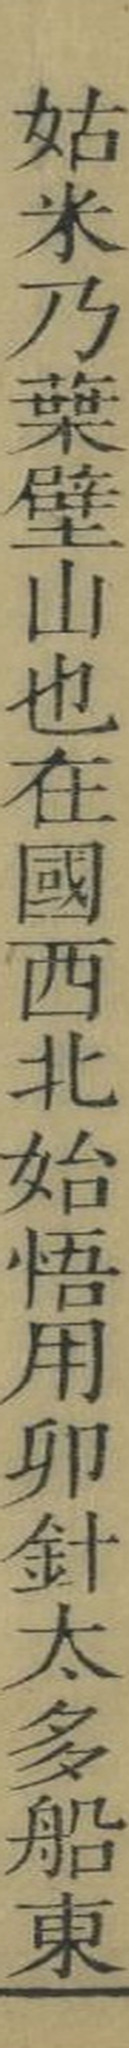姑米乃葉壁山也在國西北始悟用卯針太多船東
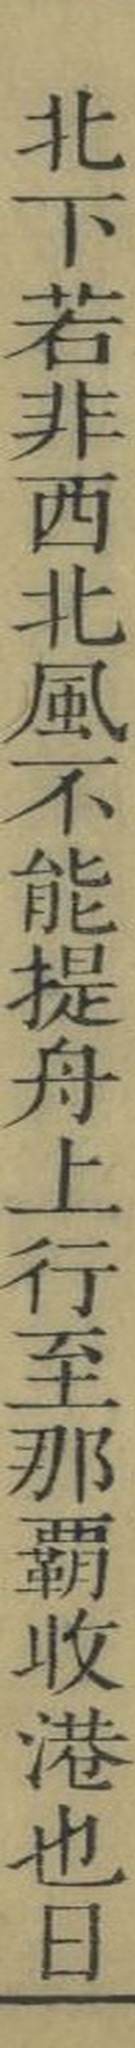北下若非西北風不能提舟上行至那覇收港也日
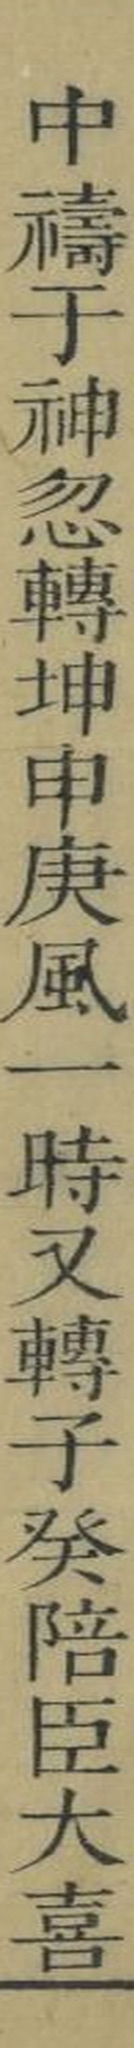中禱于神忽轉坤申庚風一時又轉子癸陪臣大喜
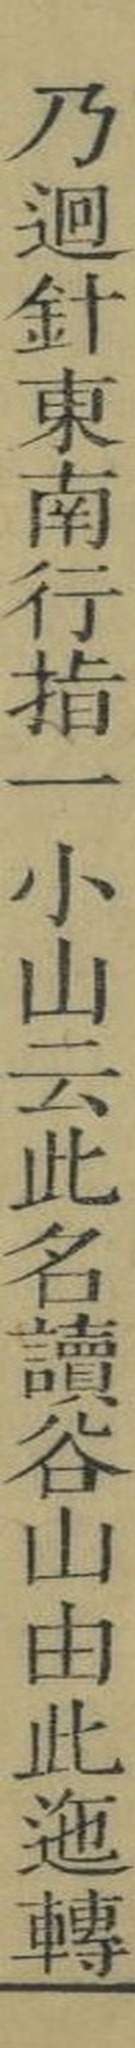乃迴針東南行指一小山云此名讀谷山由此迤轉
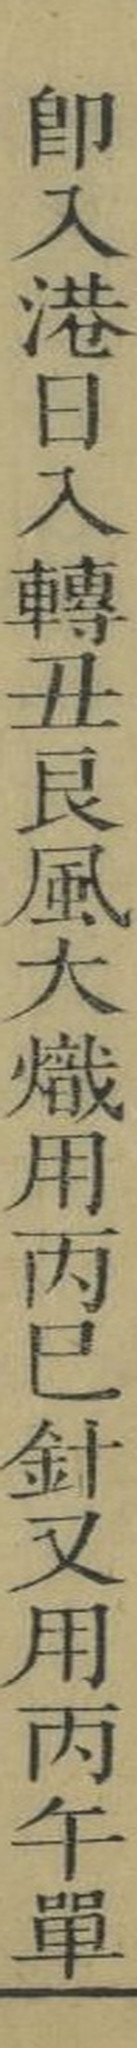卽入港日入轉丑艮風大熾用丙巳針又用丙午單
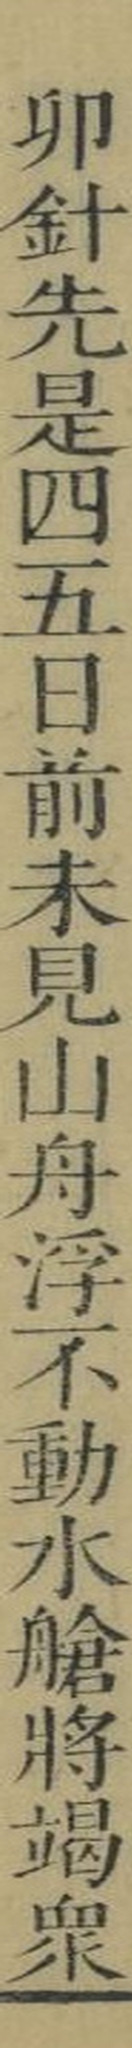卯針先是四五日前未見山舟浮不動水艙將竭衆
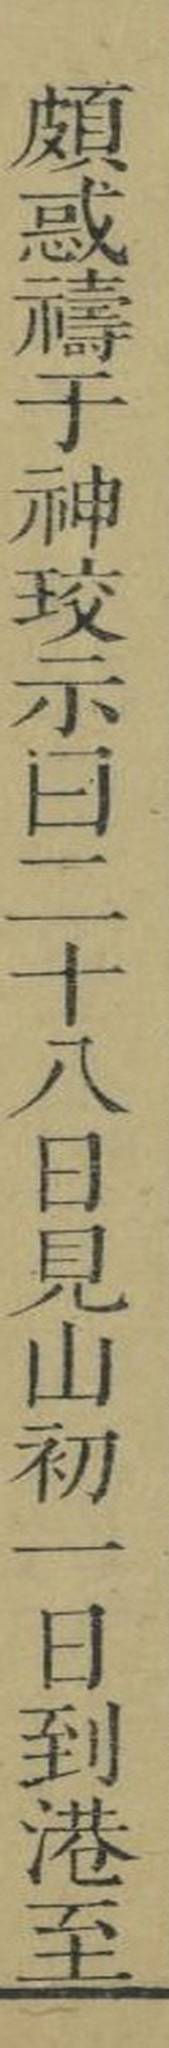頗惑禱于神珓示曰二十八日見山初一日到港至
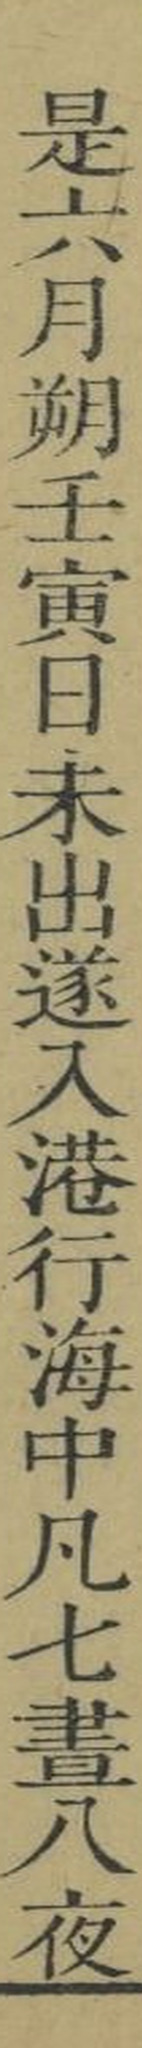是六月朔壬寅日未出遂入港行海中凡七晝八夜
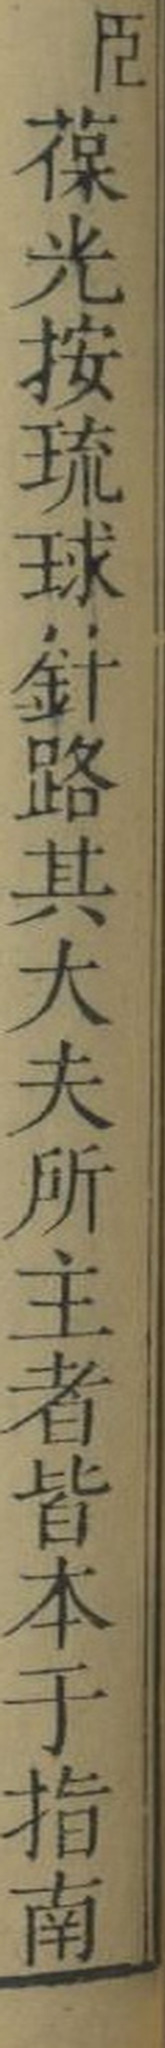臣葆光按琉球針路其大夫所主者皆本于指南
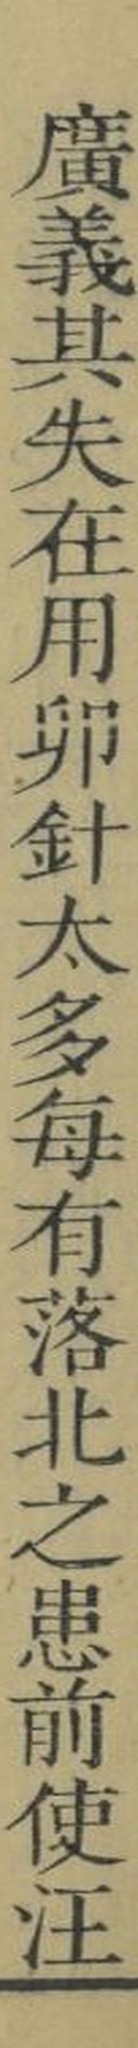廣義其失在用卯針太多每有落北之患前使汪
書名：中山伝信録 巻一
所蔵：University of the Ryukyus Library
